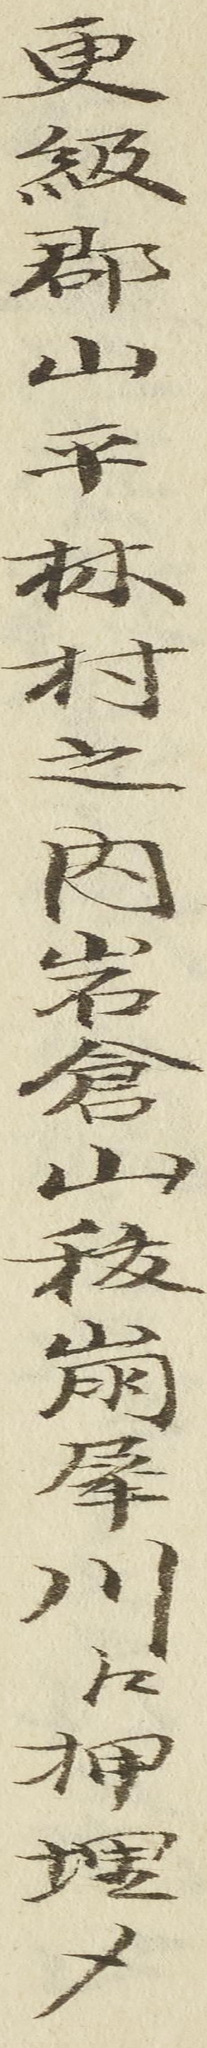更級郡山平林村之内岩倉山抜崩犀川江押
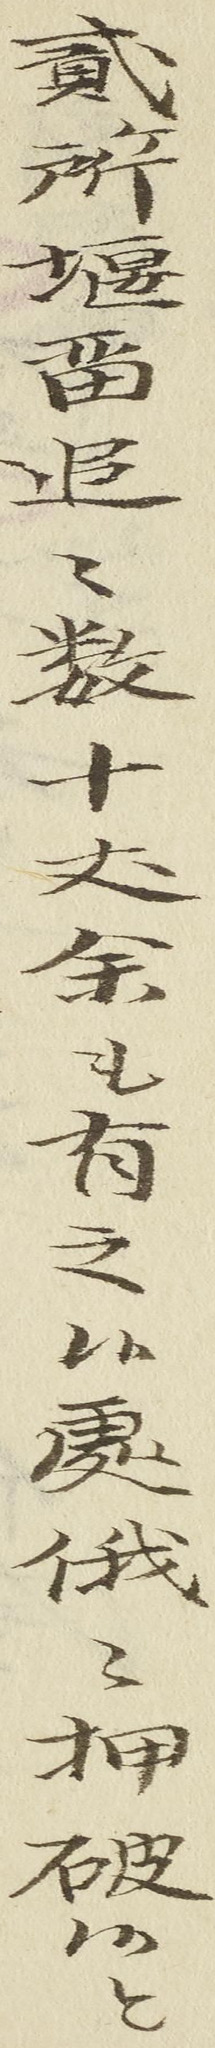弐ヶ所堰留追々数十丈余も有之候処俄二押破候と
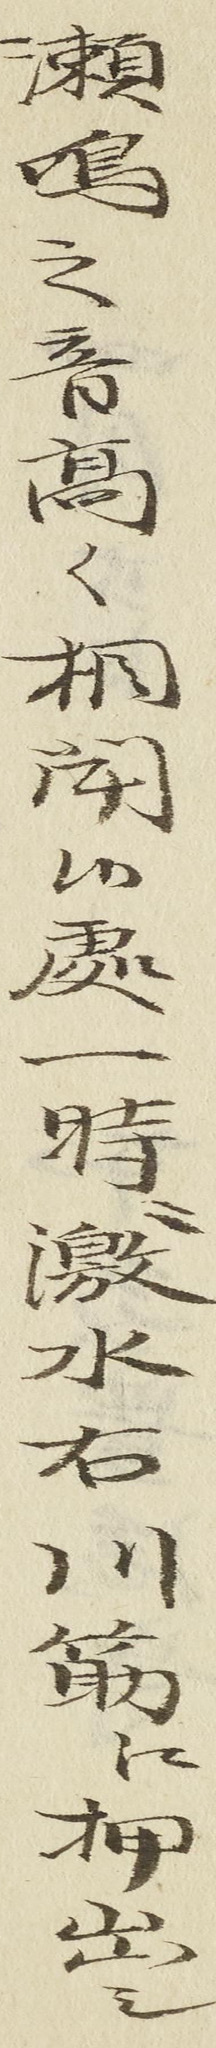高く相聞候処一時二激水右川筋江押出ㇱ
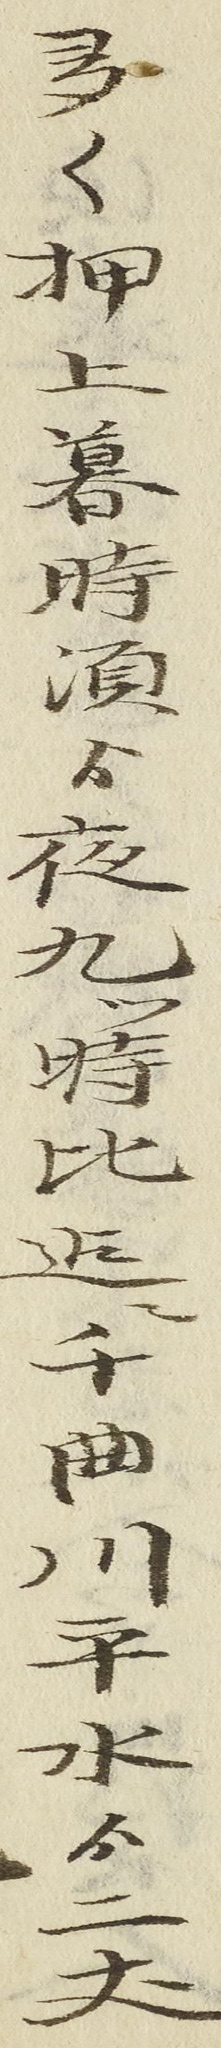多く押上暮時頃ゟ夜九ッ時比迄二千曲川平水ゟ二丈
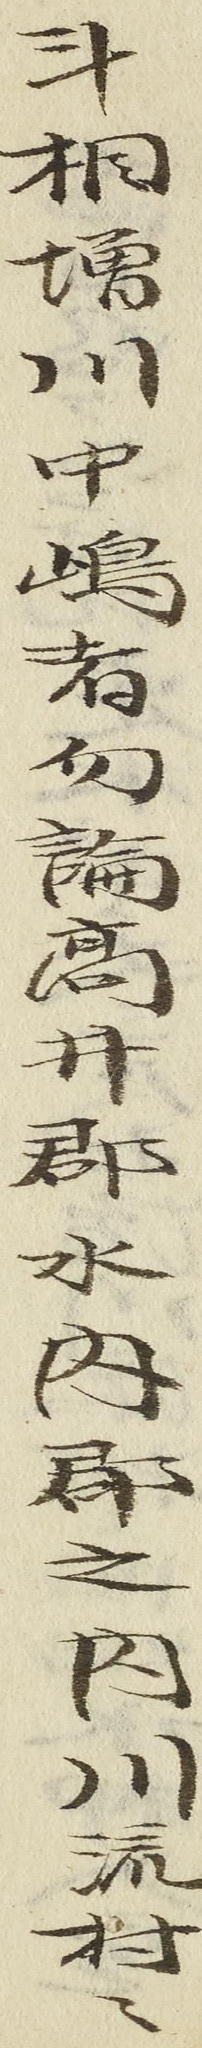斗相増川中嶋は勿論高井郡水内郡之内川添
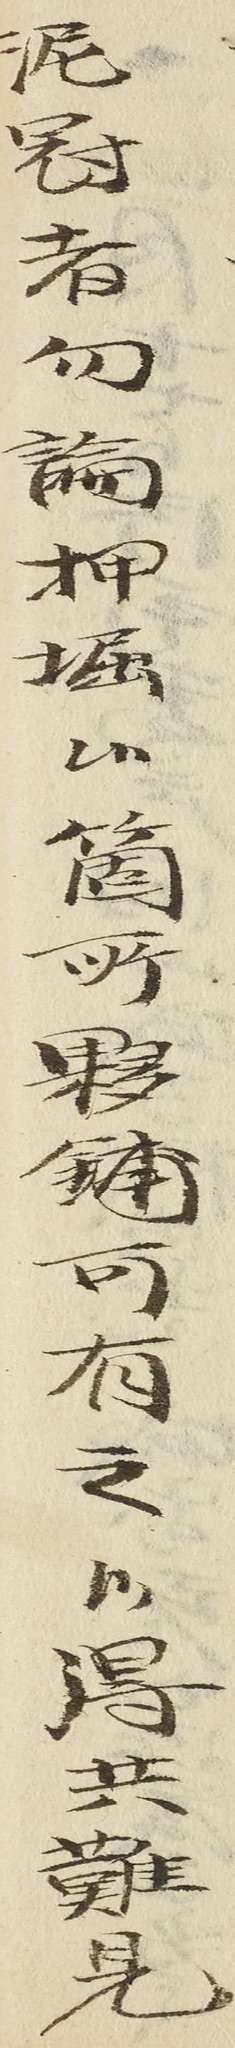泥冠は勿論押堀候箇所夥鋪可有之候得共難見
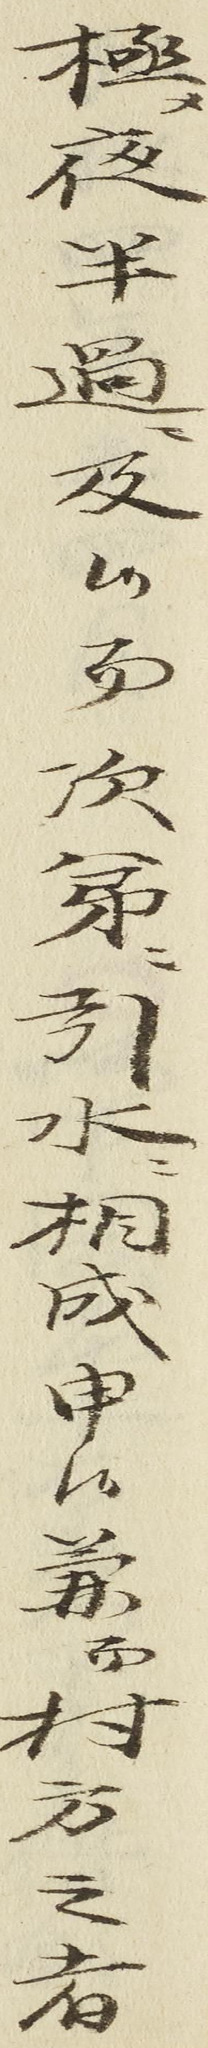極メ夜半過二及候而次第二引水二相成申候兼而村方之者
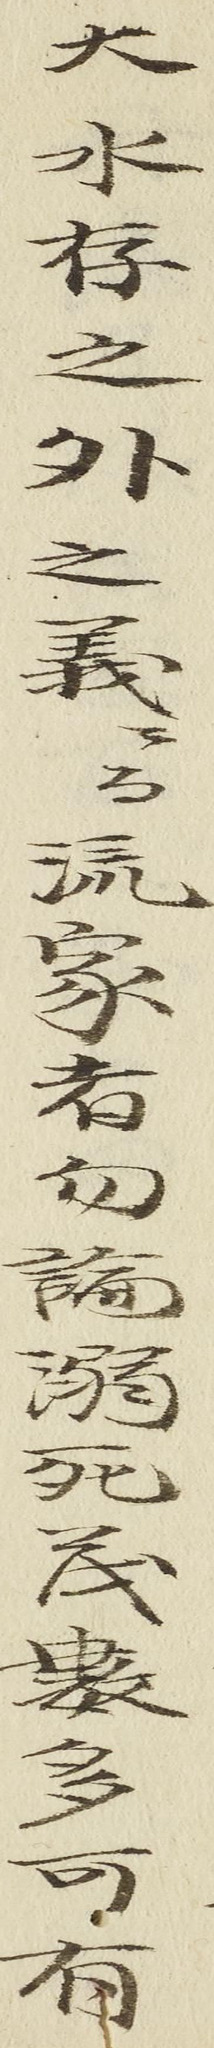大水存之外之儀二而流家は勿論溺死も数多可有
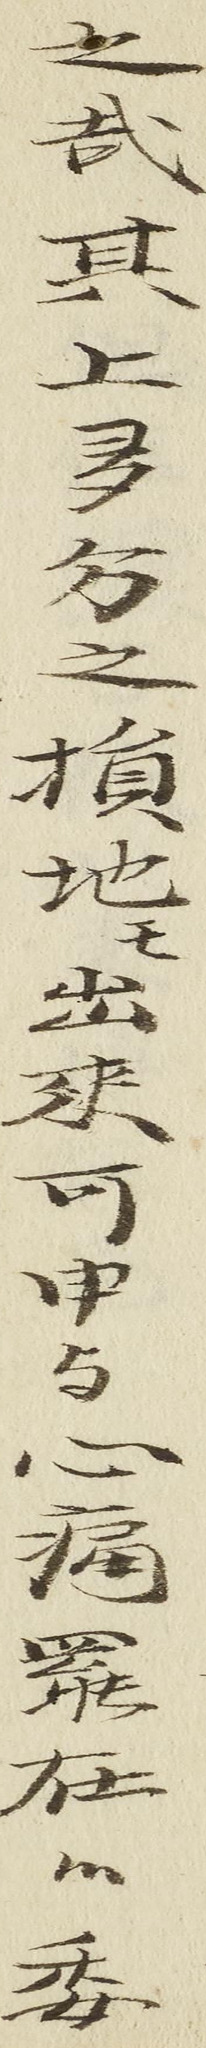之哉其上多分之損地モ出来可申と心痛罷在候委
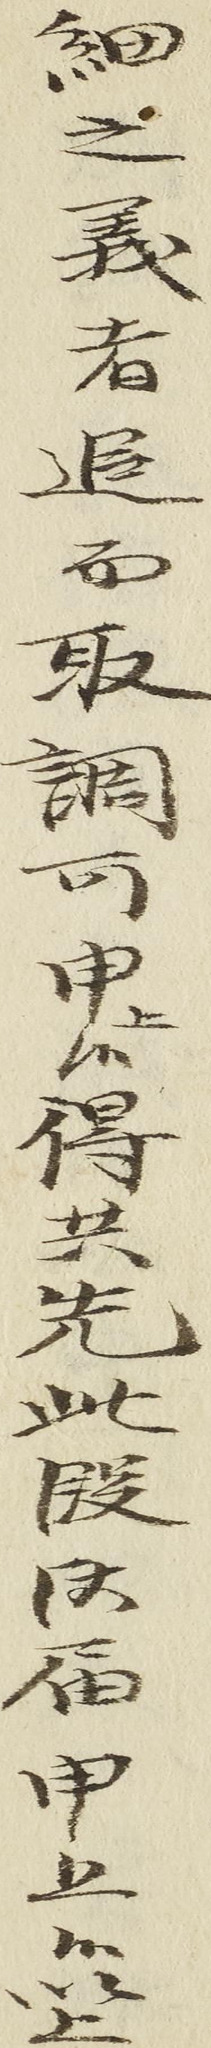細之義は追而取調可申上候得共先此段御届申上候以上

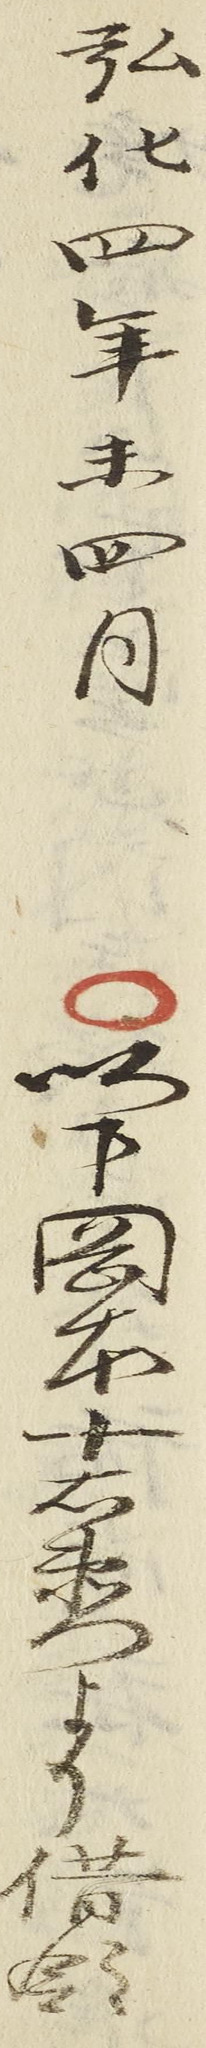弘化四年未四月○以下岡本十右衛門より借領
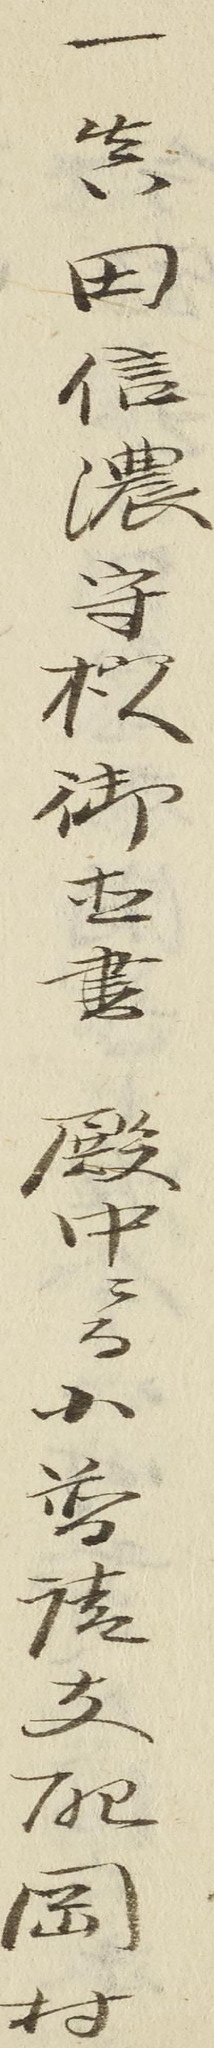一真田信濃守様御直書殿中二而小普請支配岡村
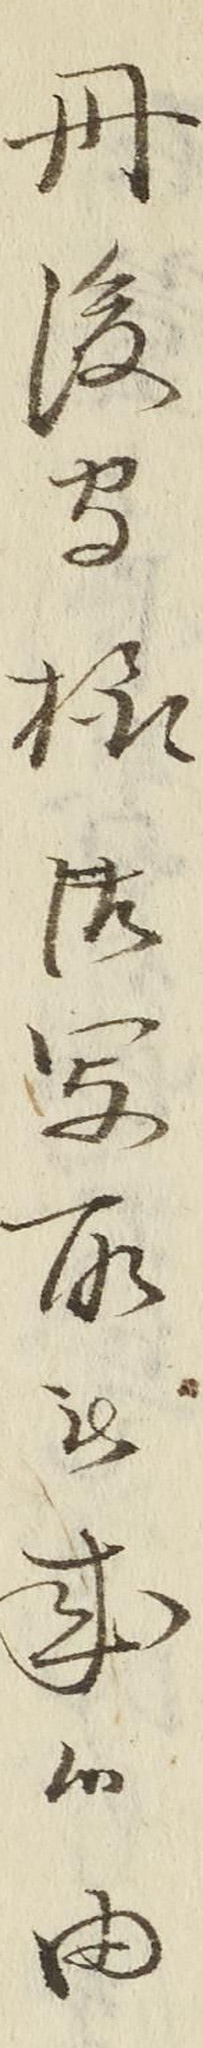丹後守様御写取被成候由
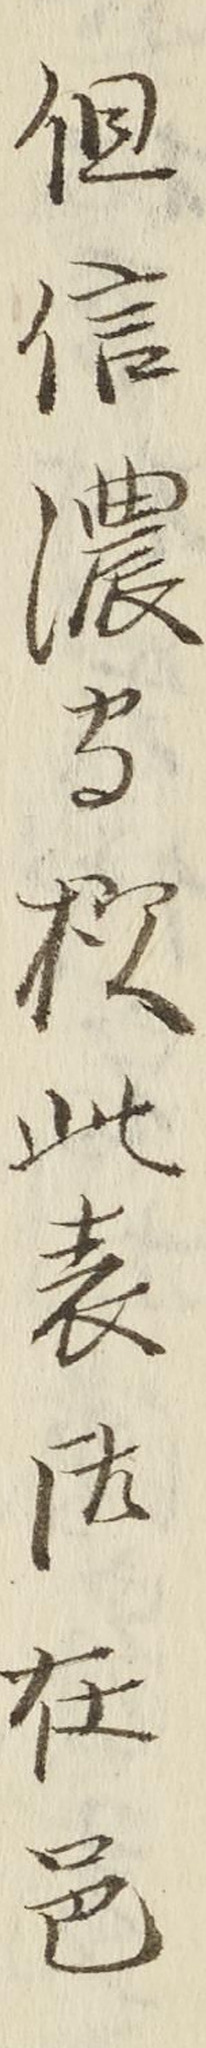但信濃守様此表御在邑
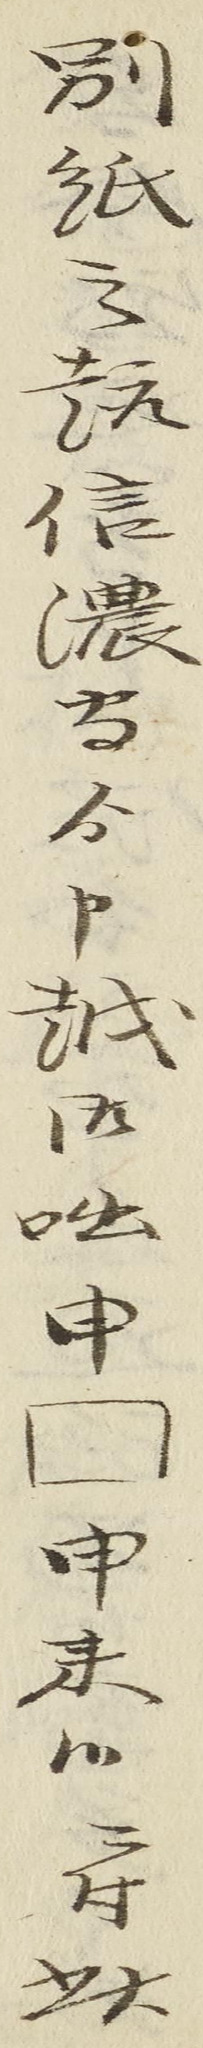別紙之趣信濃守ゟ申越御咄中口申来候二付此
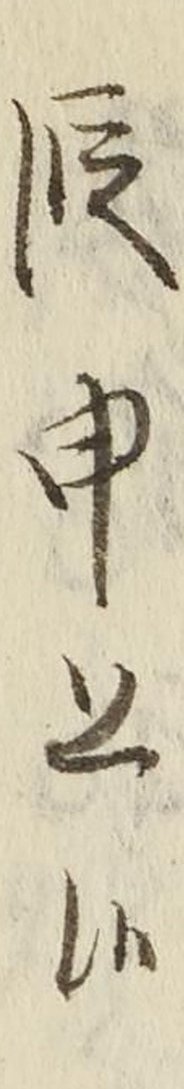段申上候
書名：信濃國大地震記　乾
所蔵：東京大学地震研究所図書室 Earthquake Research Institute Library, The University of Tokyo, JAPAN
